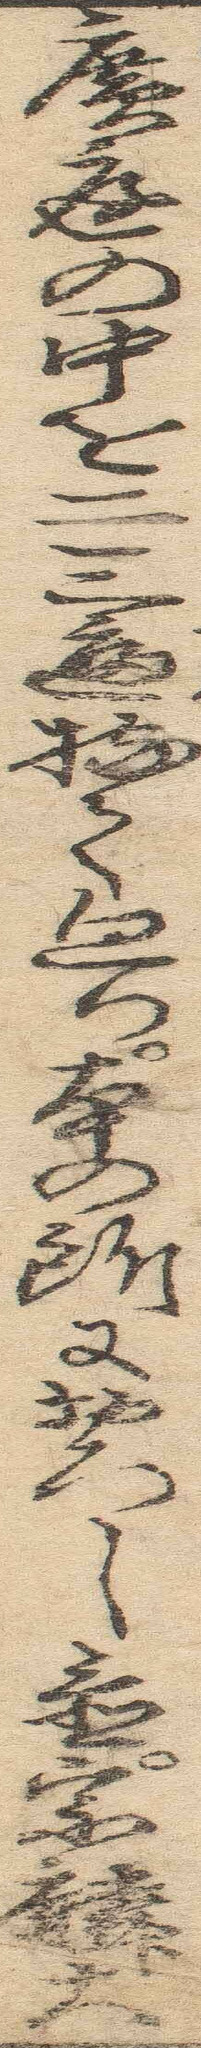広庭の中を二三辺持て廻り。本の所におろし置。宗麟大
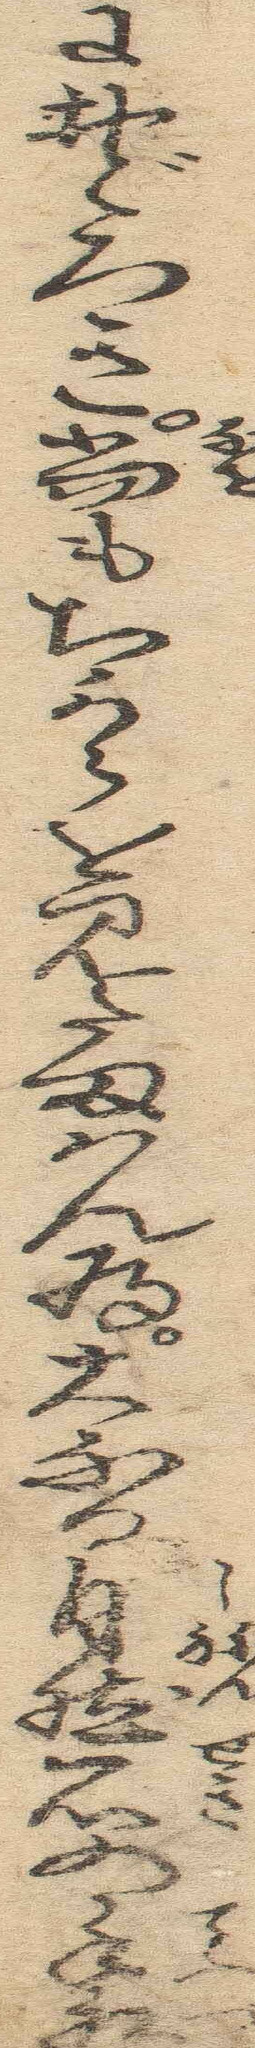におどろき尚もちからを見たまはん為。大なる自然石の手水
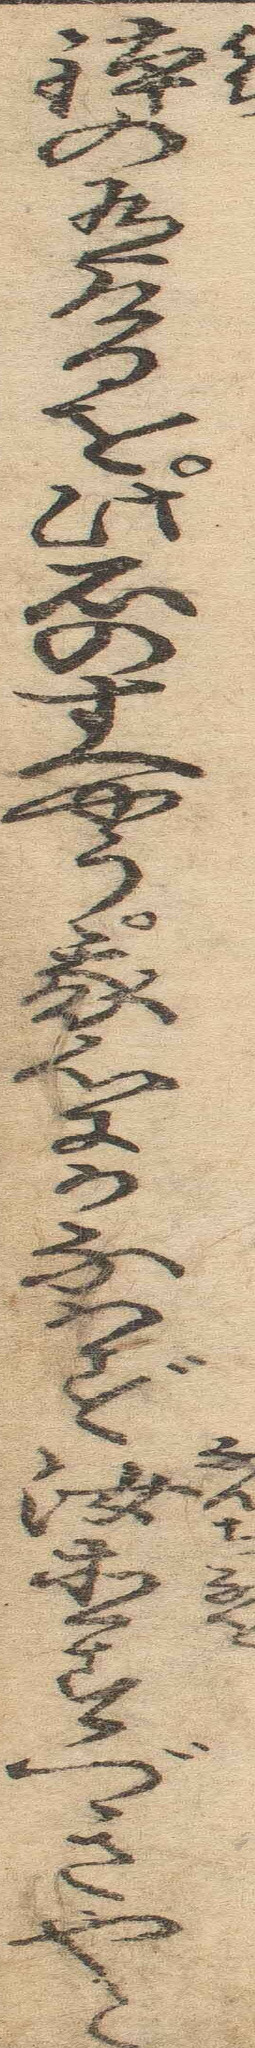鉢の有けるを。此石のすへやう我心にかなはず汝直すべきやと

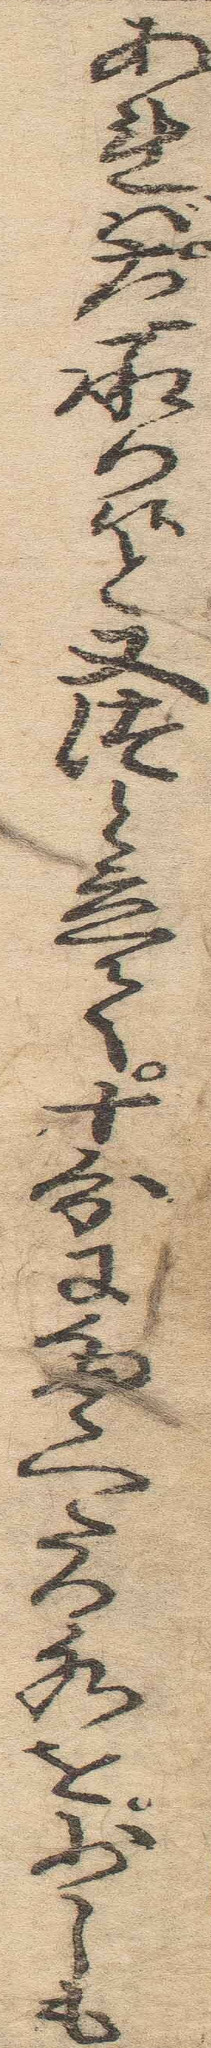あれば。右承り候と又つと立て。十分にたゝへたる水を少しも
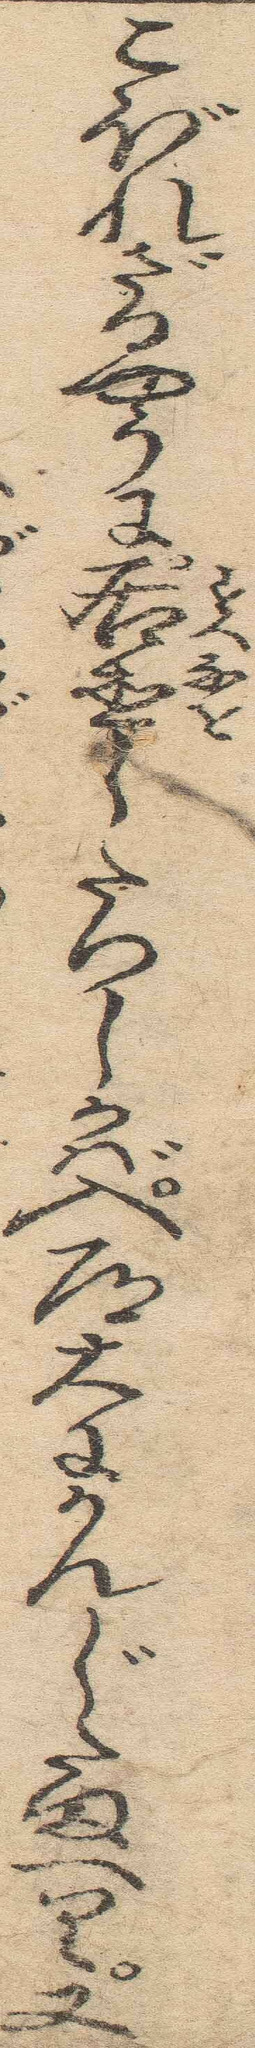こぼれざるやうに。居直したりしかば入道大にかんじたまへり。又
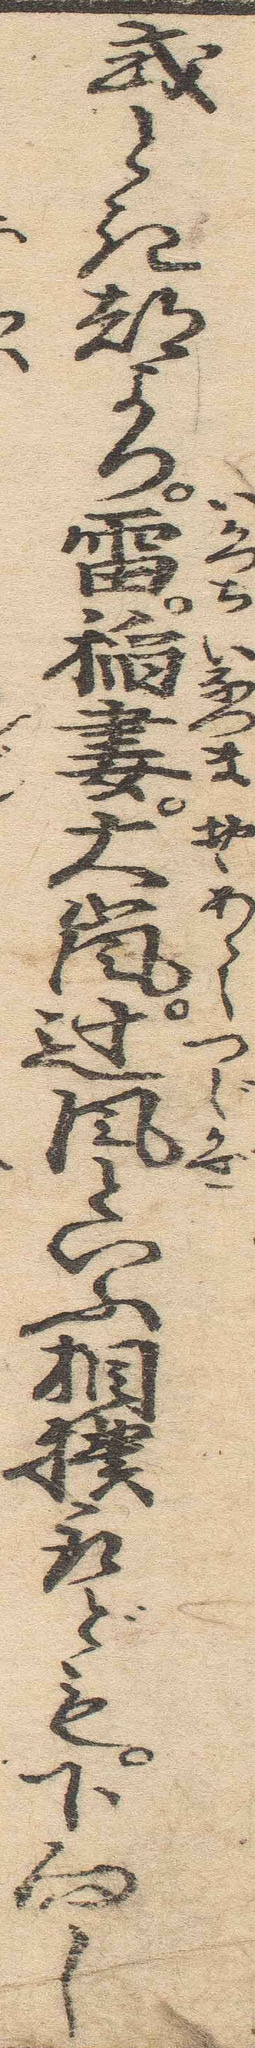或とき都より雷。稲妻。大嵐。辻風といふ相撲取ども。下向し
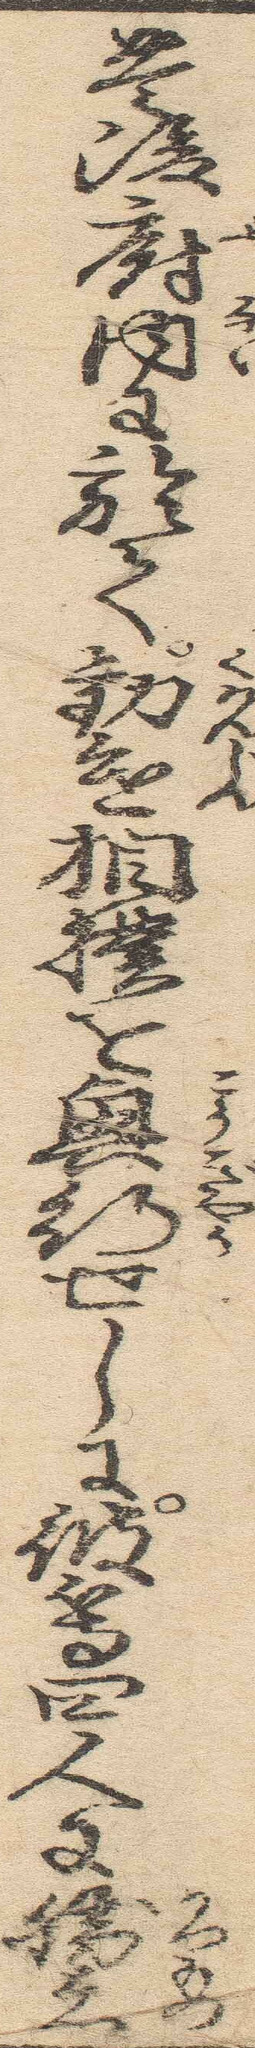豊後府内に於て勧進相撲を興行せしに。彼等四人に勝者
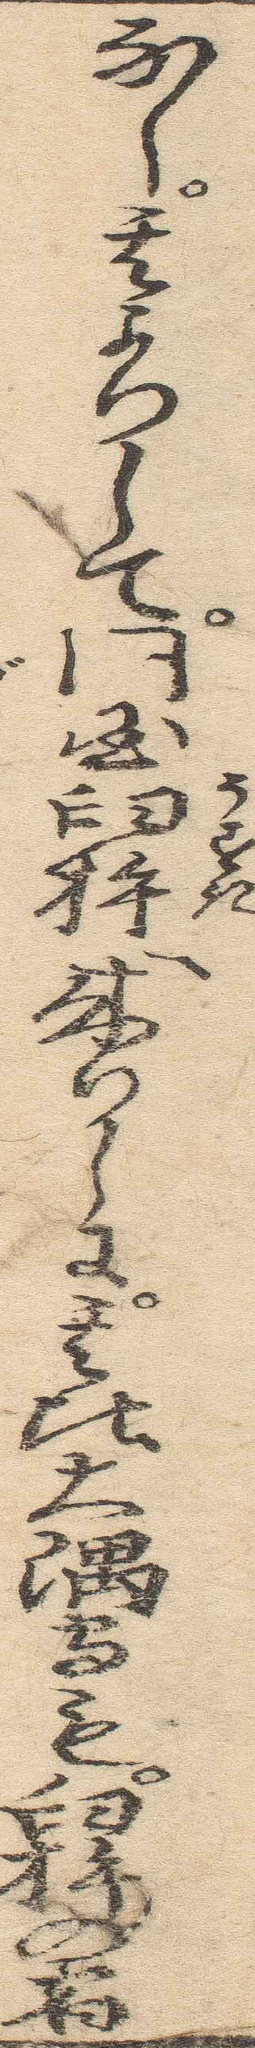なし。其よりして。同国臼杵へ来りしに。其比大隅守も臼杵の宿
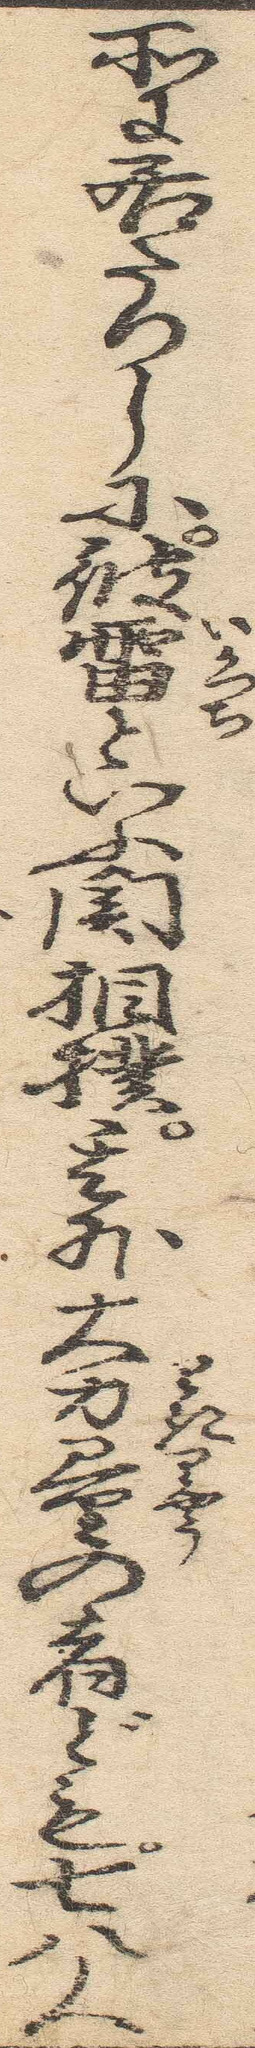所に居たりしに。彼雷といふ関相撲。其外大力量の者ども七八人
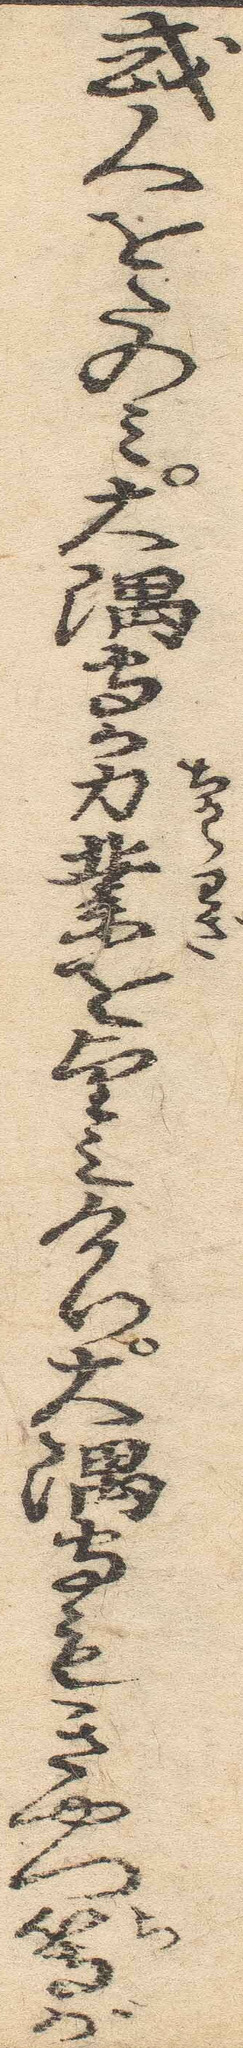或人をたのみ。大隅守か力業を望みけり。大隅守もきやつ等が
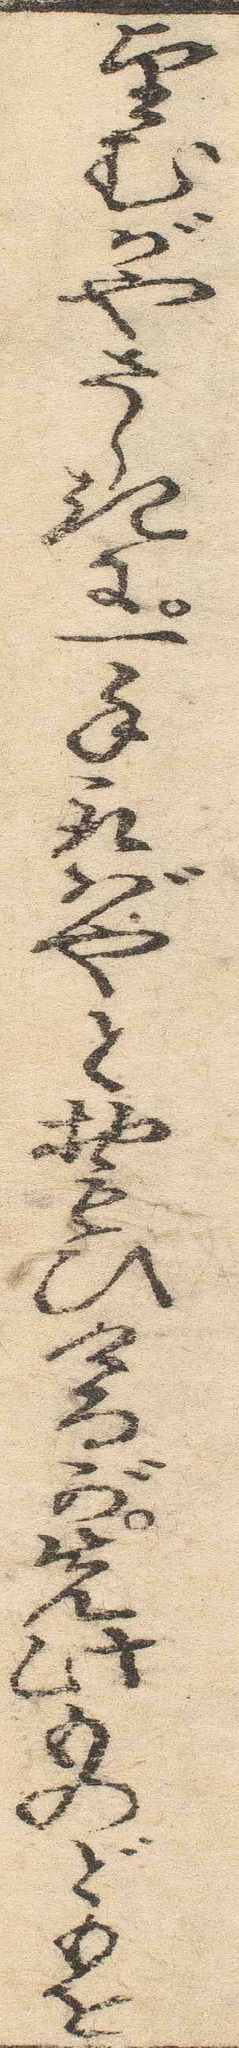望むがやさきに。一手取ばやとおもひけるが。先此ものどもを
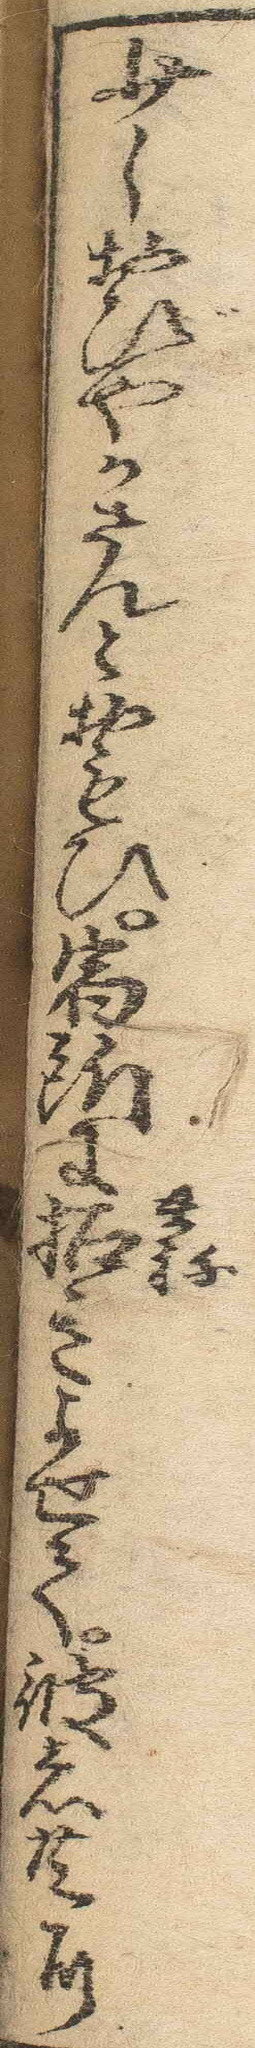少しおびやかさんとおもひ。宿所に招きよせて。彼者共に
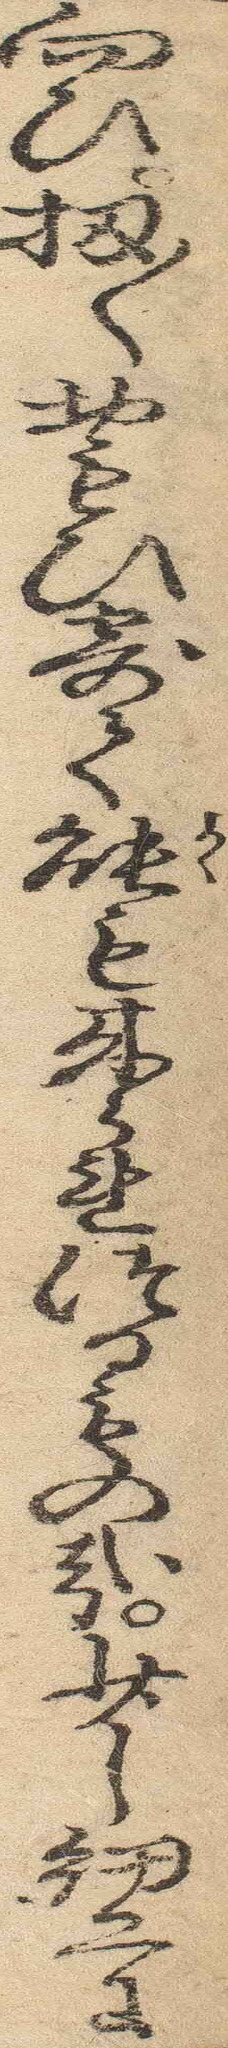向ひ。扨〳〵おもひ寄て能も来られつわもの哉。少し細工に
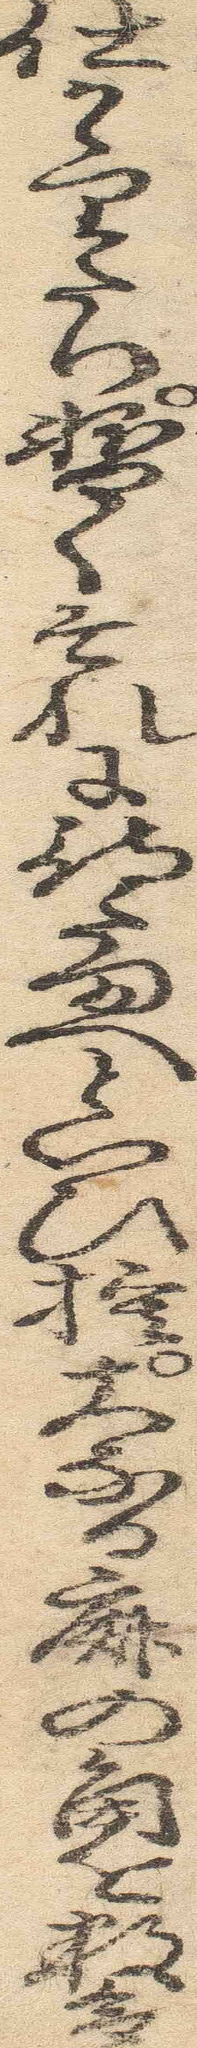仕かりたり。暫くそれに待たまへといひ捨。大なる麻の角を数多
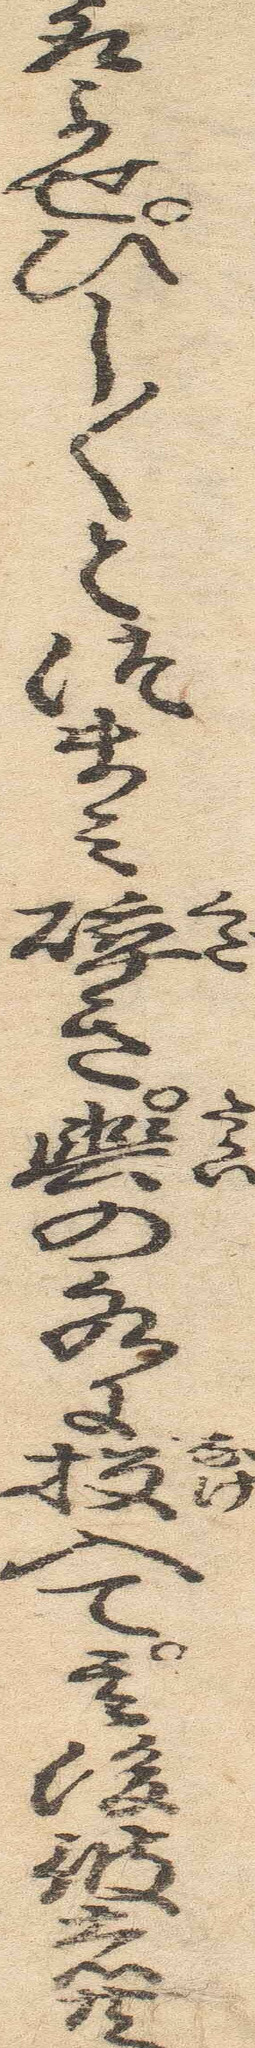取よせ。ひし〳〵とつまみ砕き。盥の水に投入て。其後彼者共
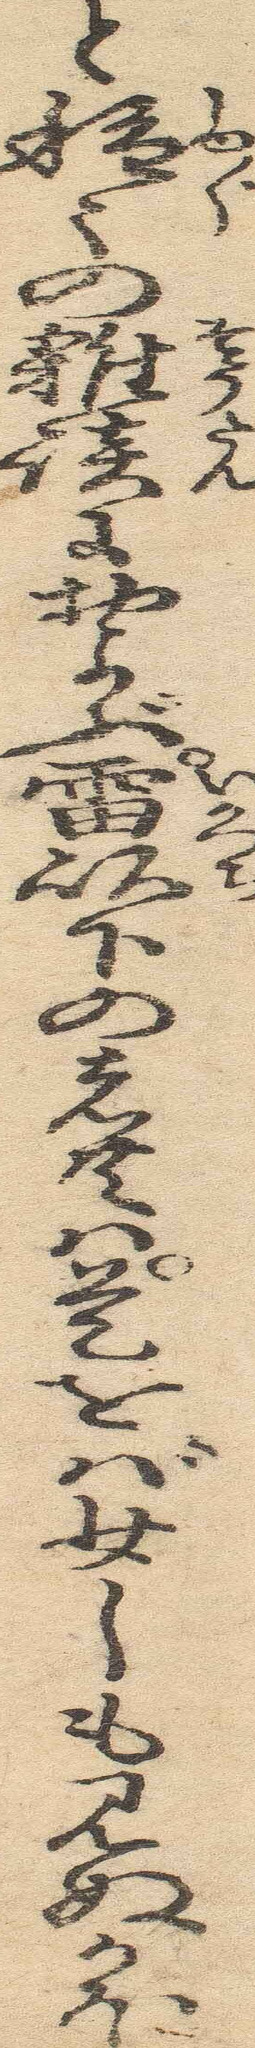と種々の雑談におよぶ。雷以下の者共は。是をば少しも見ぬかほ
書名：古今相撲大全
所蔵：東京学芸大学附属図書館 国文学研究資料館
